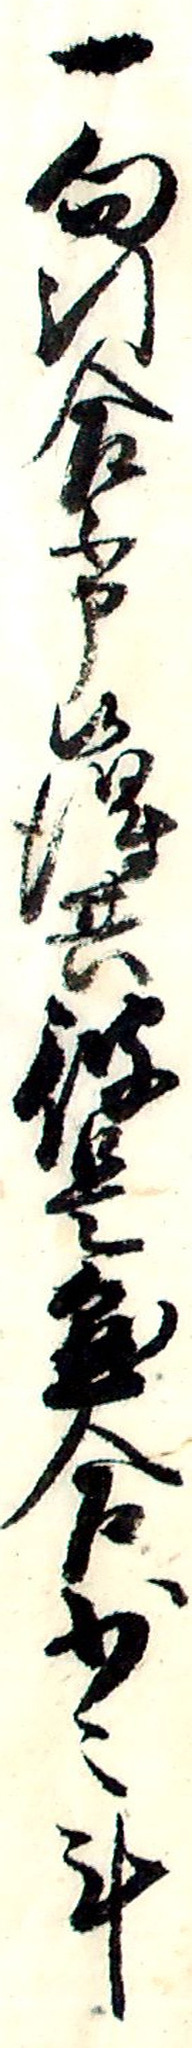一向引合不申候得共彼是懸合少々計

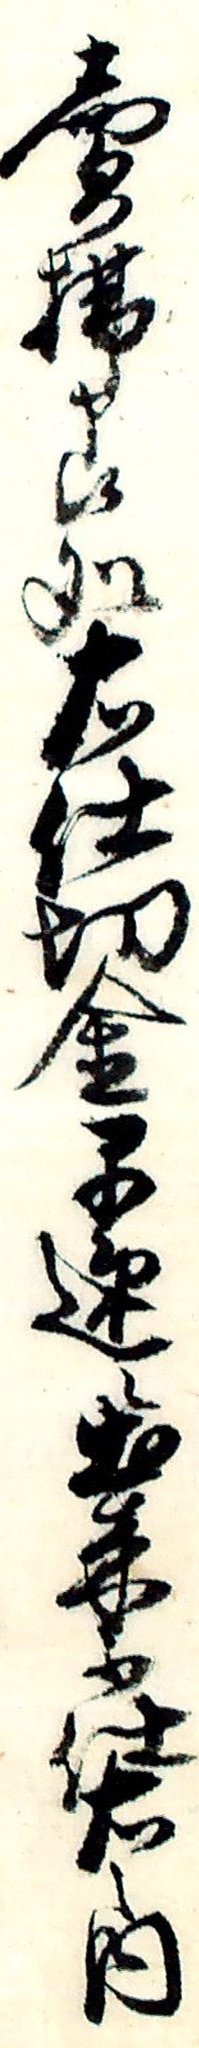賣拂申候処右仕切金早速ニ出来不仕右之内
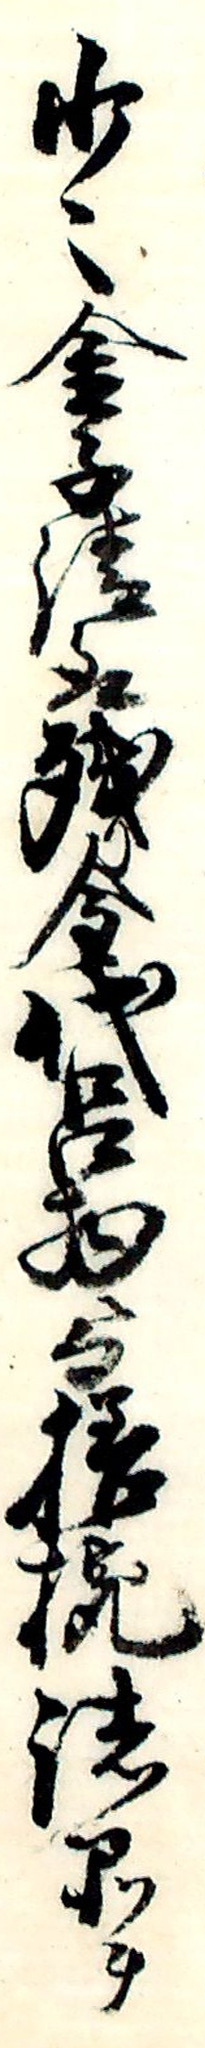少々金子請取残り金代品物ニ而膳椀諸品ヲ
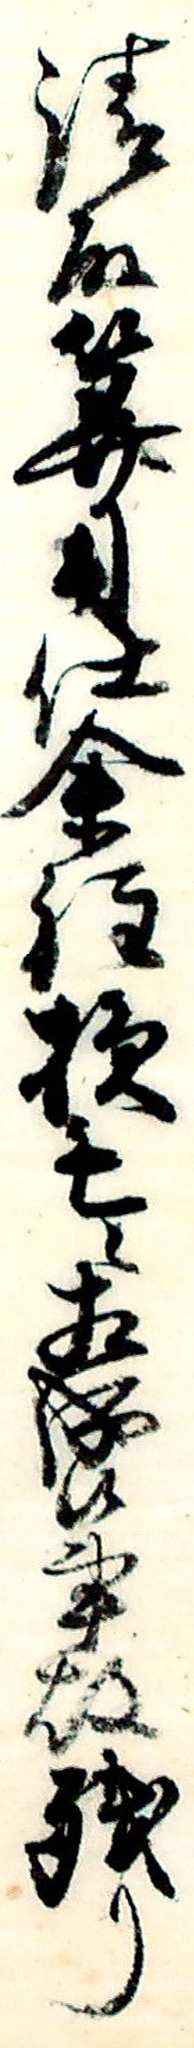請取算用仕余程損毛に相成候事故残り
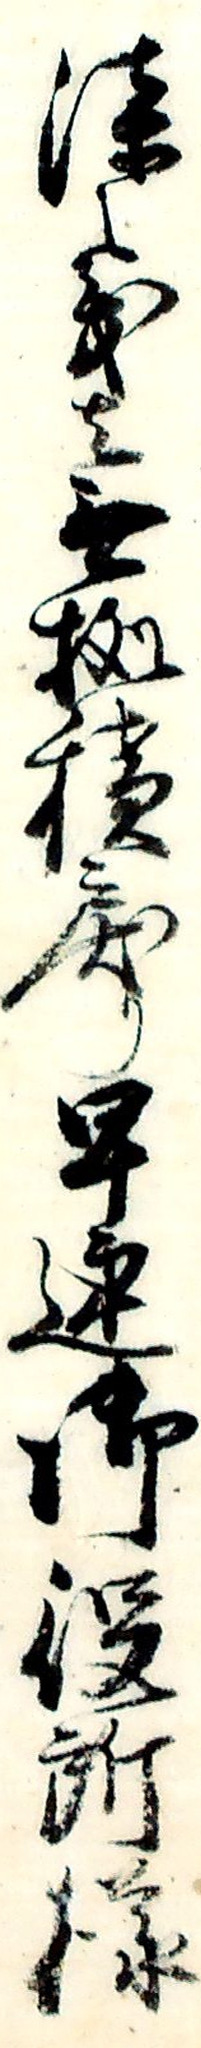漆之義者無拠積戻り早速御役所様
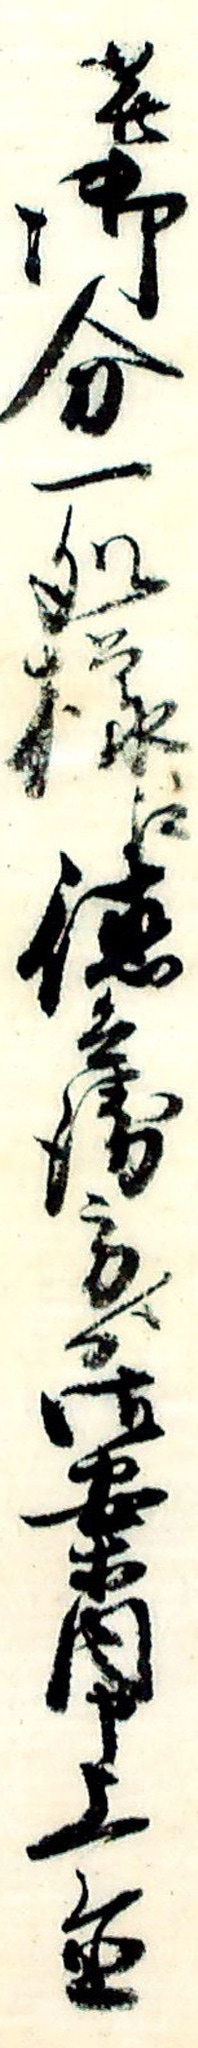幷御分一処様江徳兵衛方ゟ御案内申上置
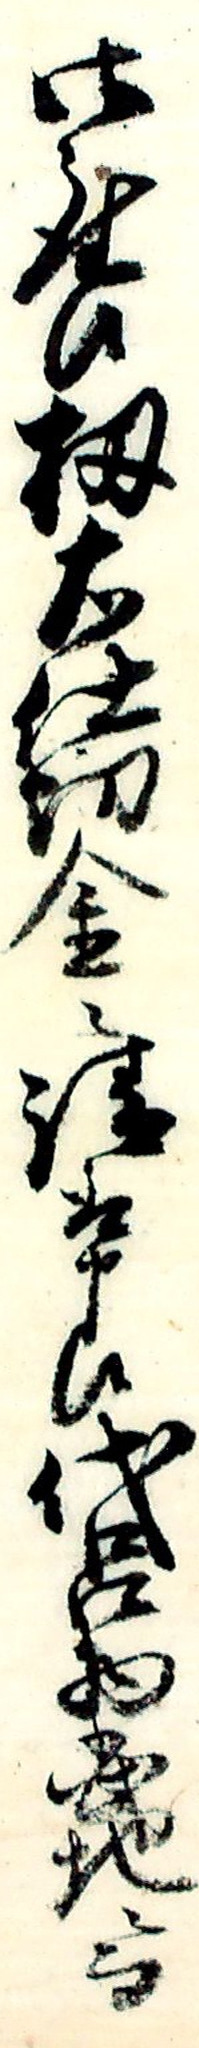御座候扨右仕切金ニ請取申候代品物當地ニ而
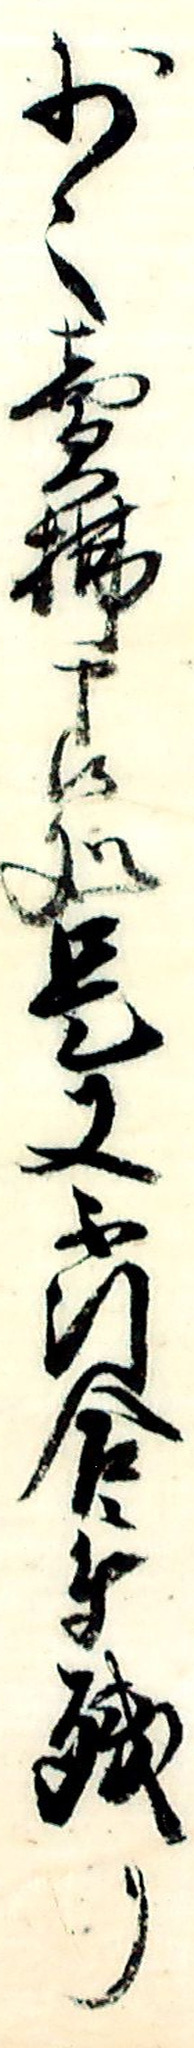少々賣拂申候処是又不引合ニ付残り
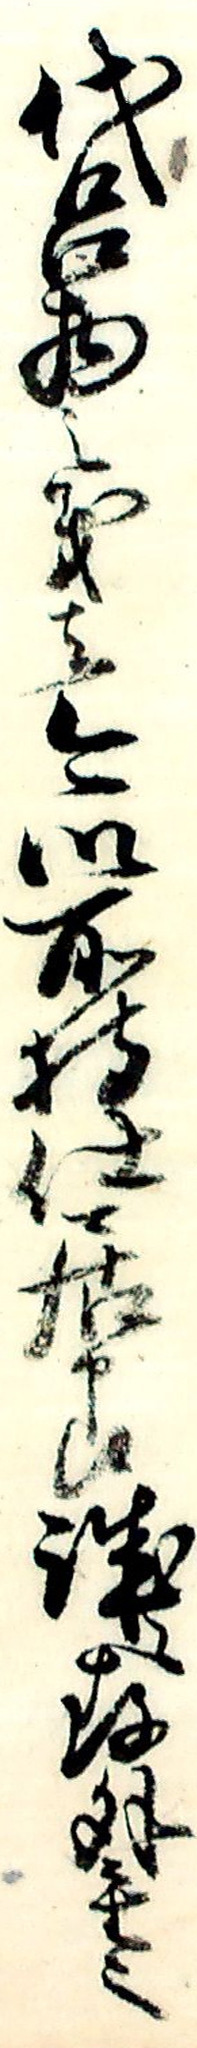代品物之義者今以所持仕居申候誠ニ存外重々
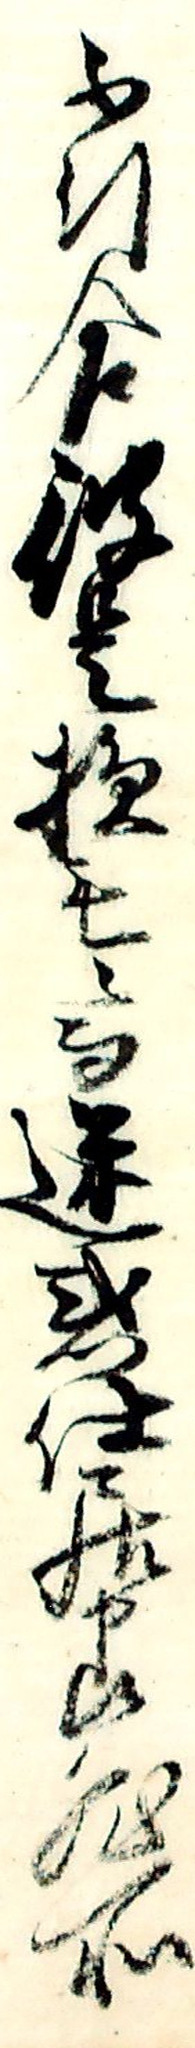不引合彼是損毛ニ而迷惑仕居申候然所
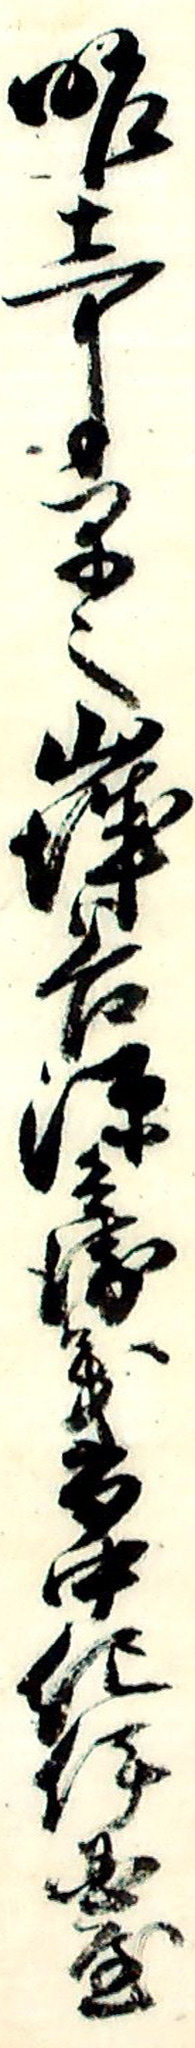昨十二月早々山城谷源兵衛義市中紀伊国屋
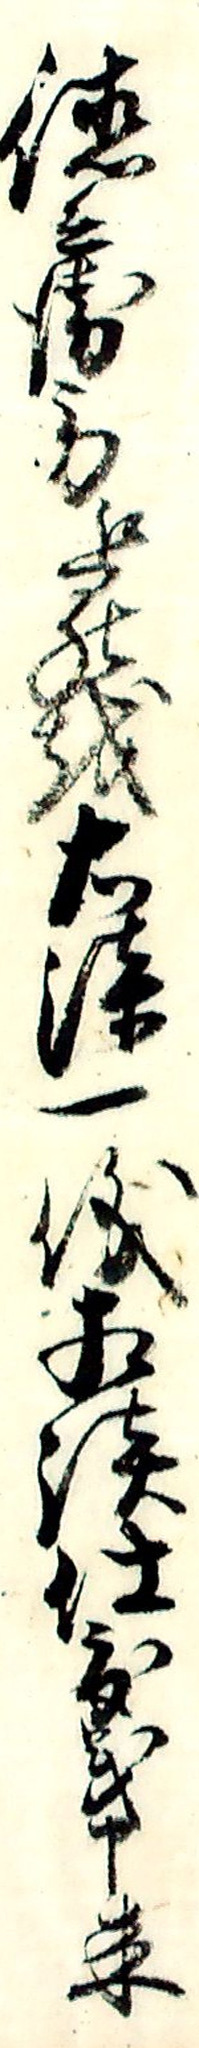徳兵衛方江罷越右漆一儀相談仕度義申来
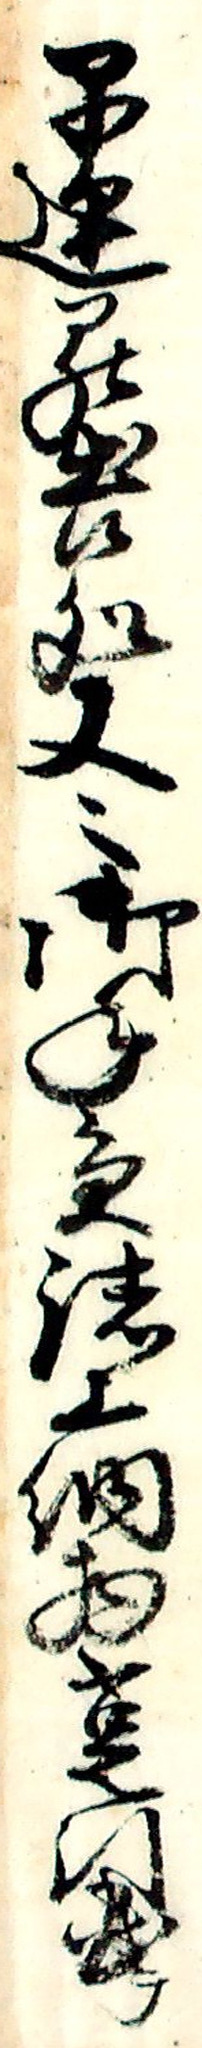早速罷出候処又々御年貢諸上納物不足引當テ
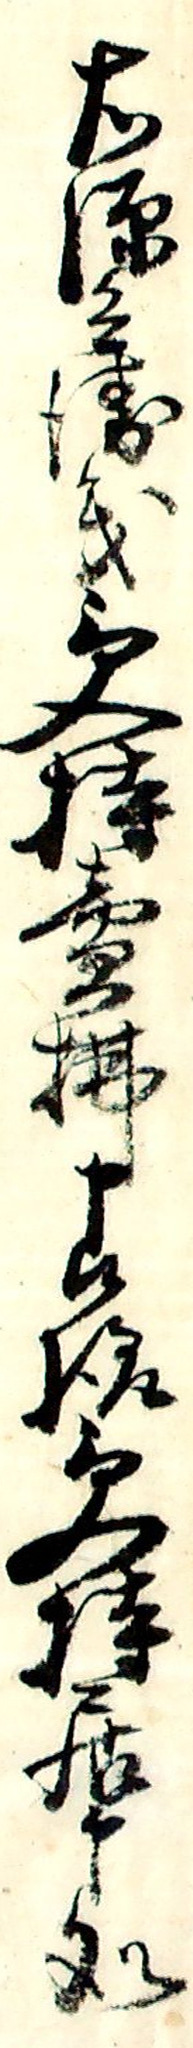右源兵衛義受持賣拂申候様受持居申処
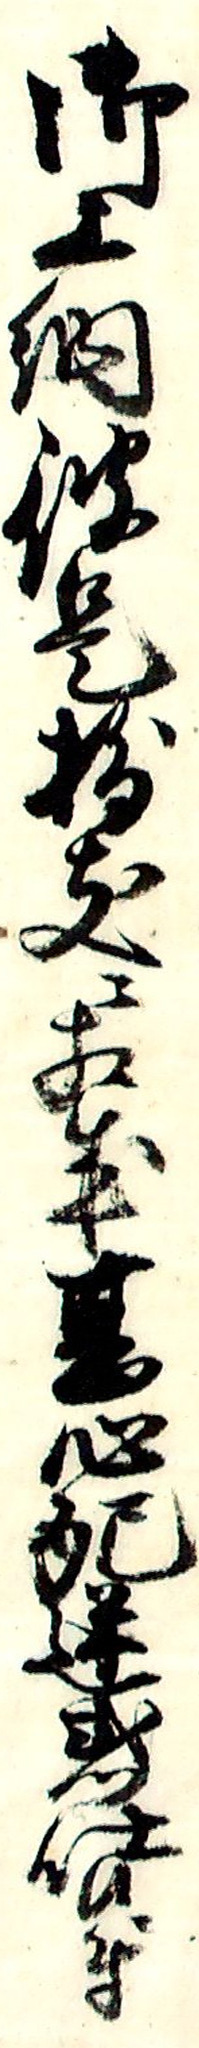御上納彼是指支ニ相成甚心配迷惑仕候ニ付
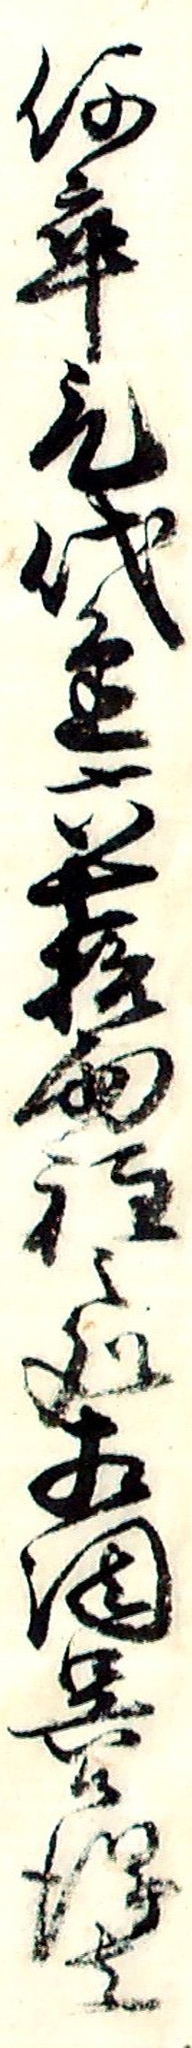何卒凡代金六七拾両程之処相調呉候得者
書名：奉申上覚（山城谷漆仕入買入銀主之義に付）
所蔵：鳴門教育大学 Naruto University of Education
